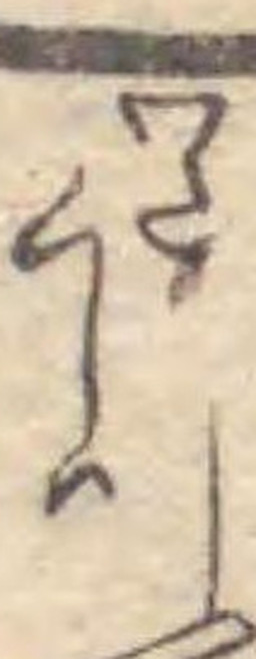くしは
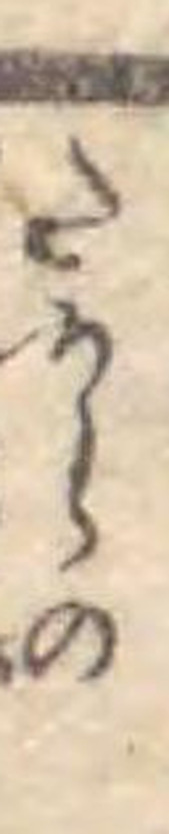たからの
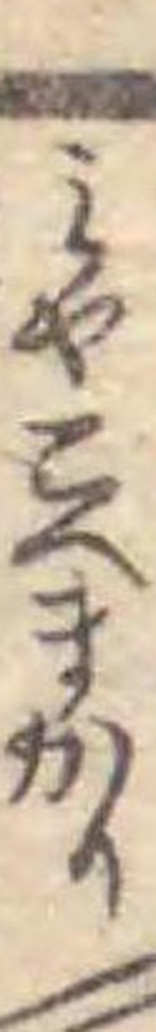みやこへまかり
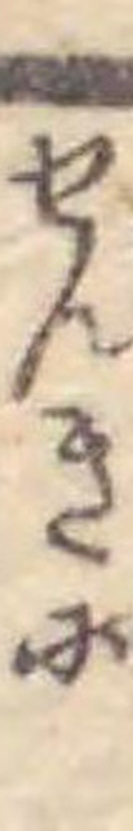せんきに
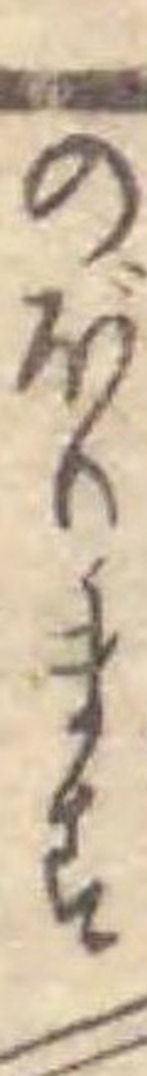のぼります
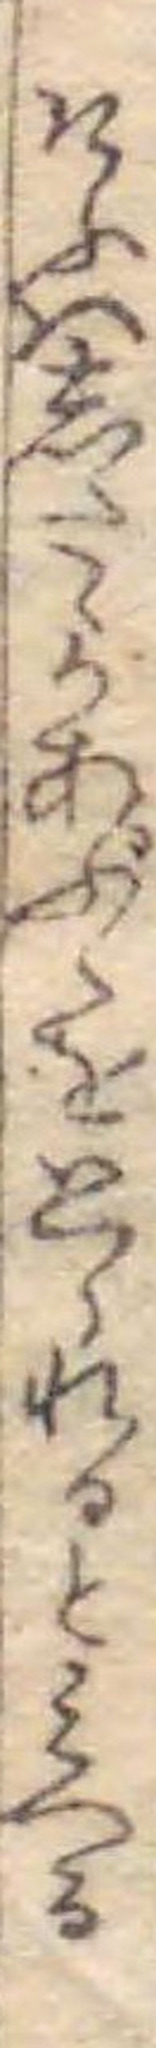けふはしたゝかあぶらをとられるとみへる
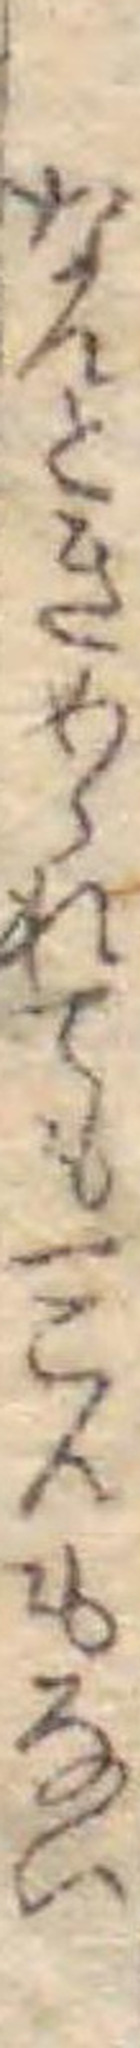なんときめられても一こんもない

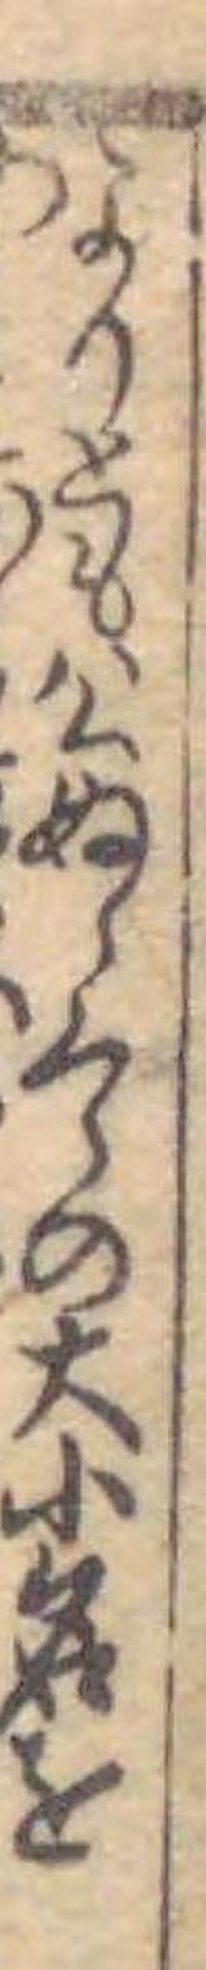よりとも公ぬらくらの大小名を
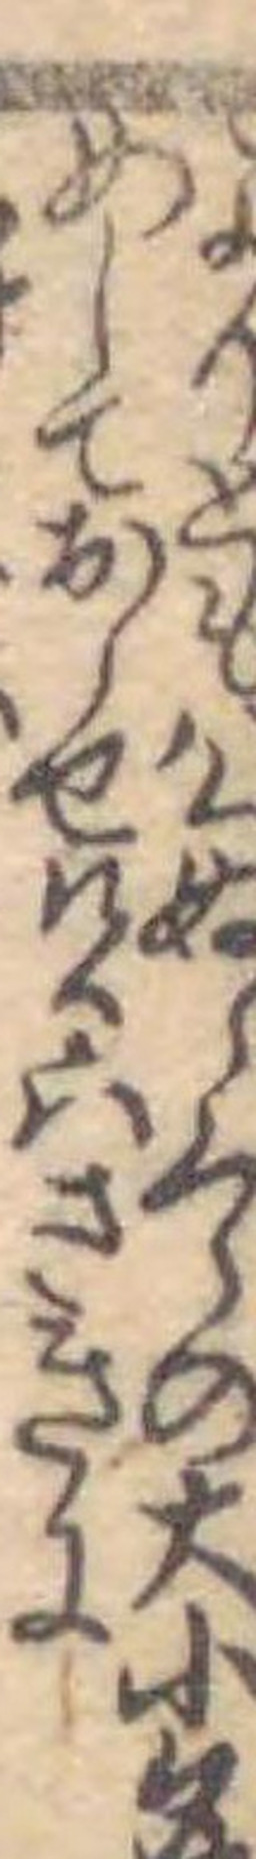めしておゝせけるはさきに
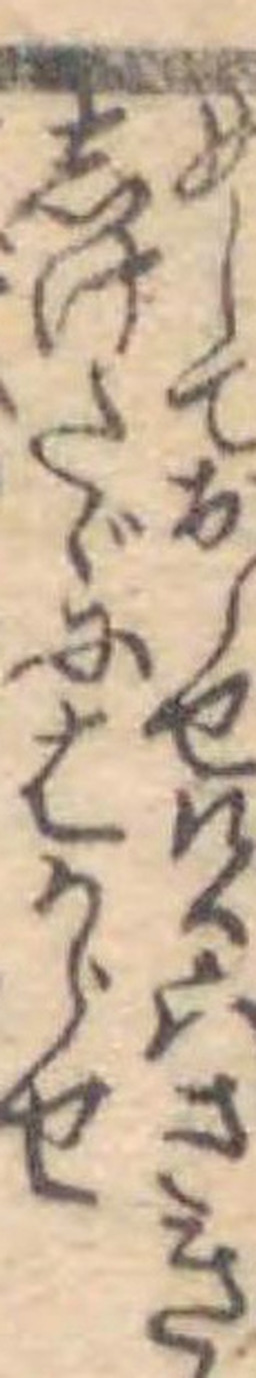しけたゞにはからせ
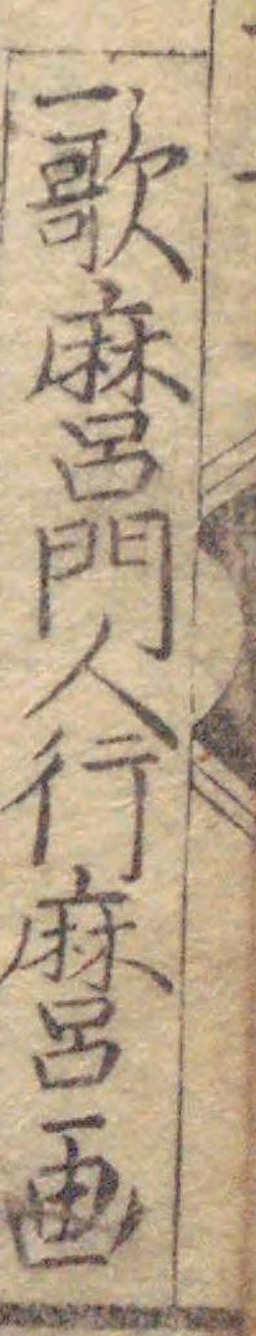歌麿門人行麿画
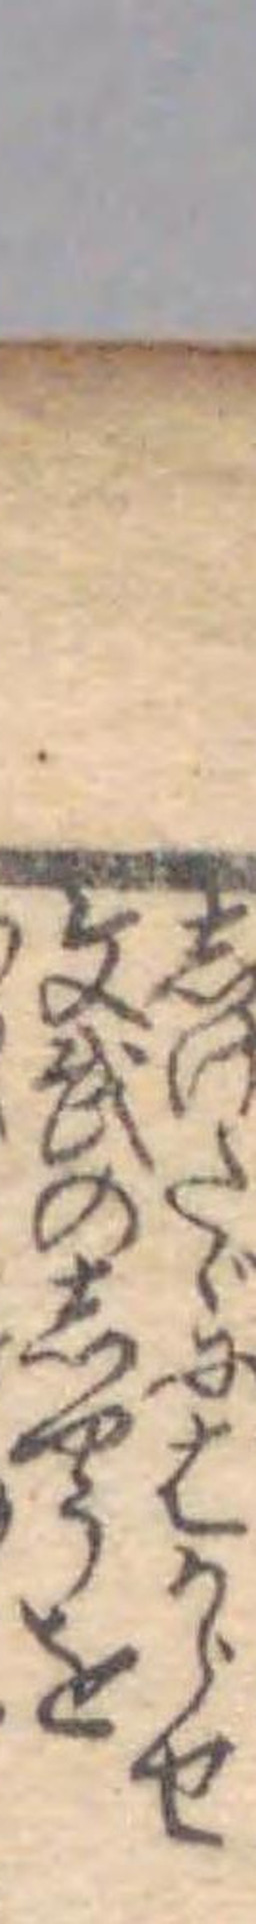文武のしやうを
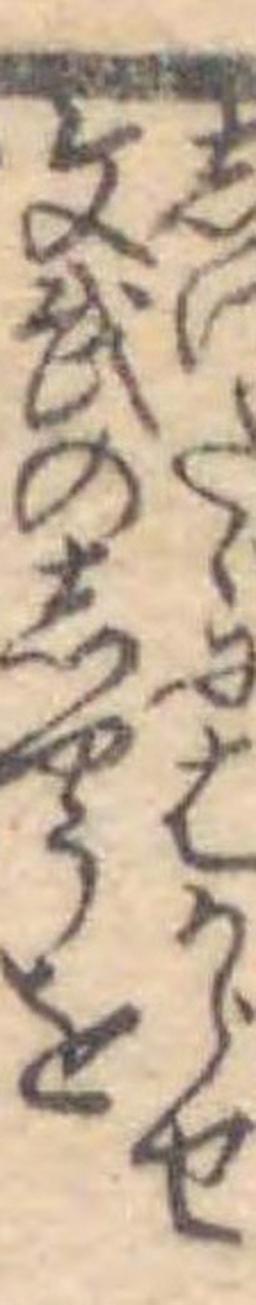文武のしやうを
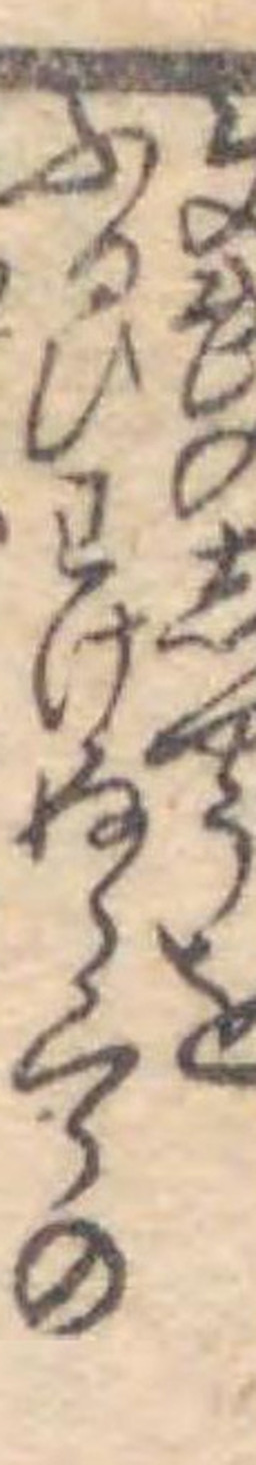ふるひわけぬらくらの
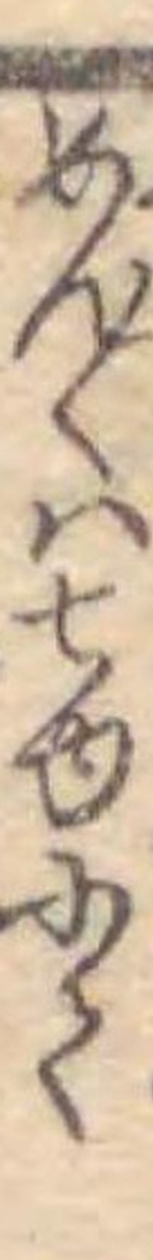めん〳〵は七ゆにて
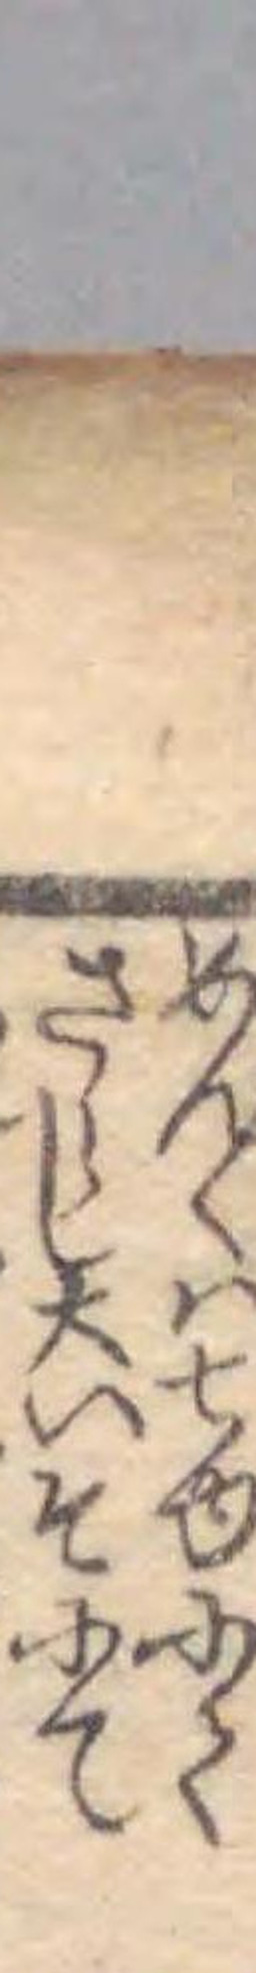さらし大いそにて
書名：文武二道万石通 : 3巻
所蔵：国立国会図書館 National Diet Library, JAPAN
